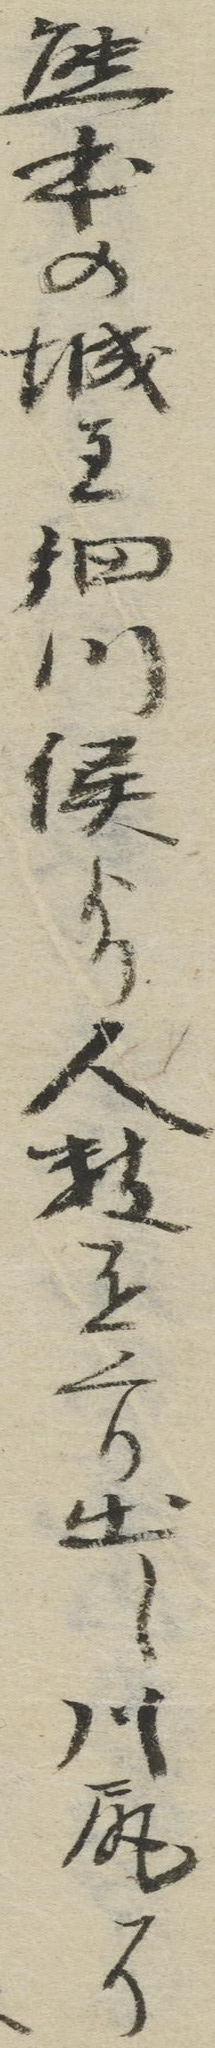熊本の城主細川侯より人数をくり出し川尻に
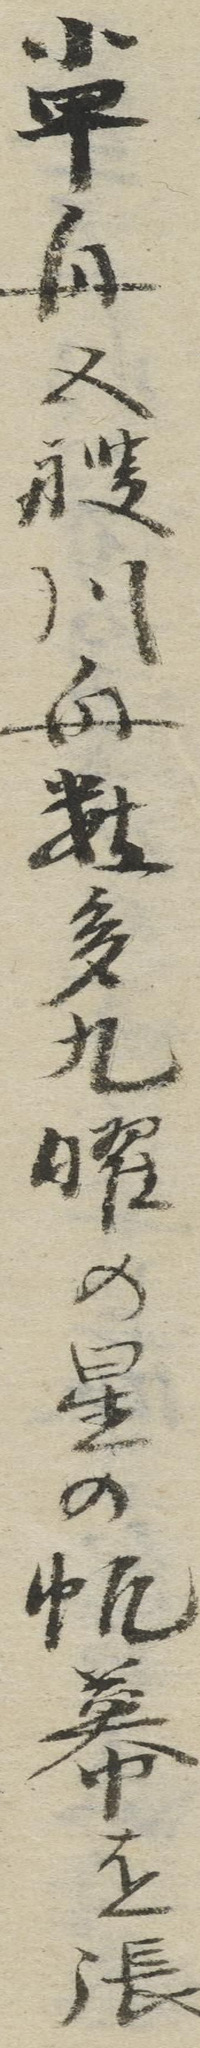小早舟五艘川舟数多九曜の星の帆幕を張
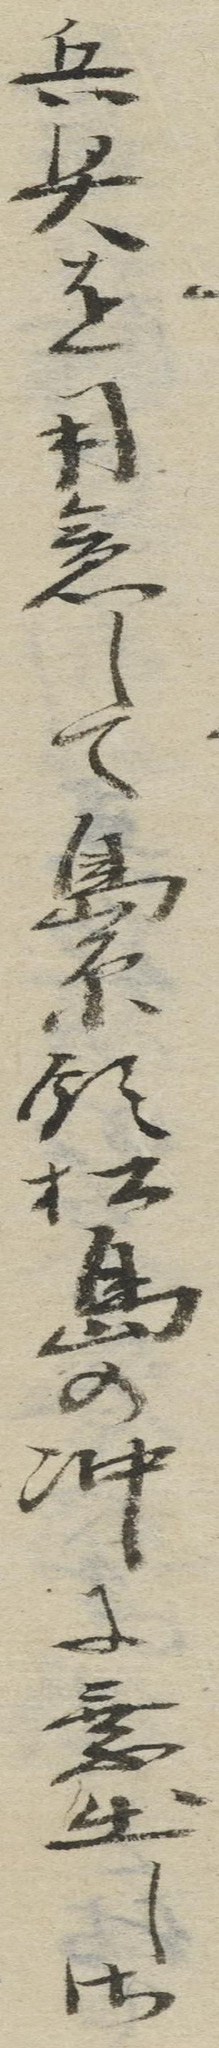兵具を用意し島原領松島の沖に乗出し御
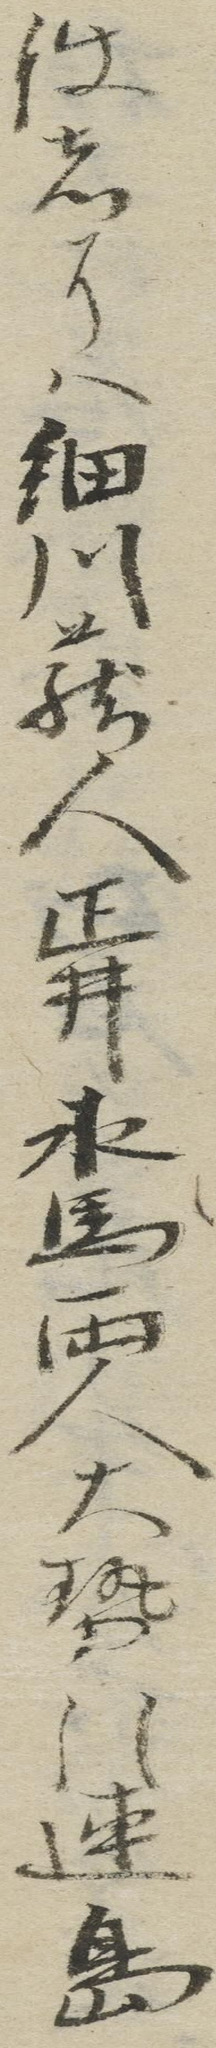使者にハ細川蔵人正井求馬両人大勢引連島
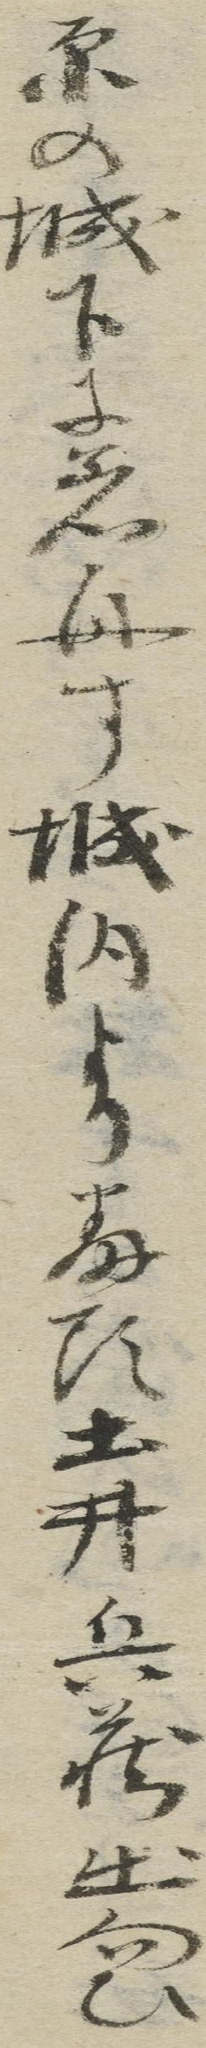原の城下に着舟す場内より番頭土井兵蔵出向ひ
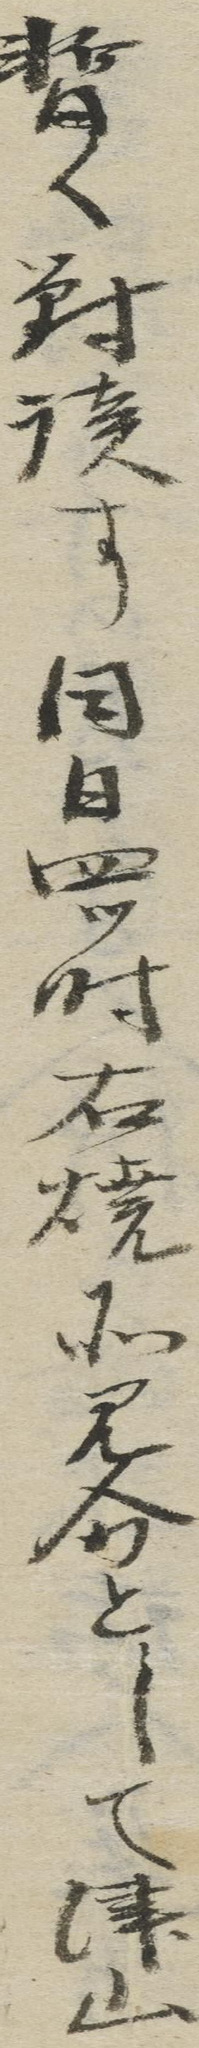暫く対談す同日四ツ時右焼所見分として津山
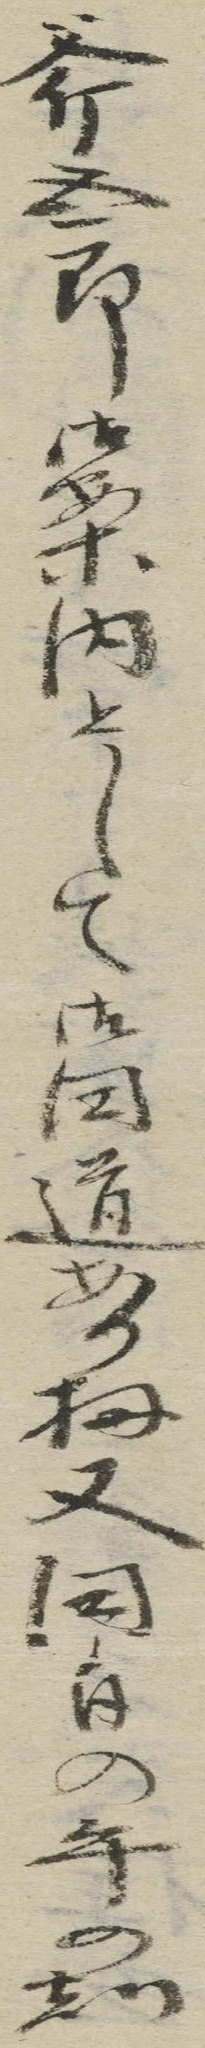斧五郎御案内として御同道あり扨又同日午の刻
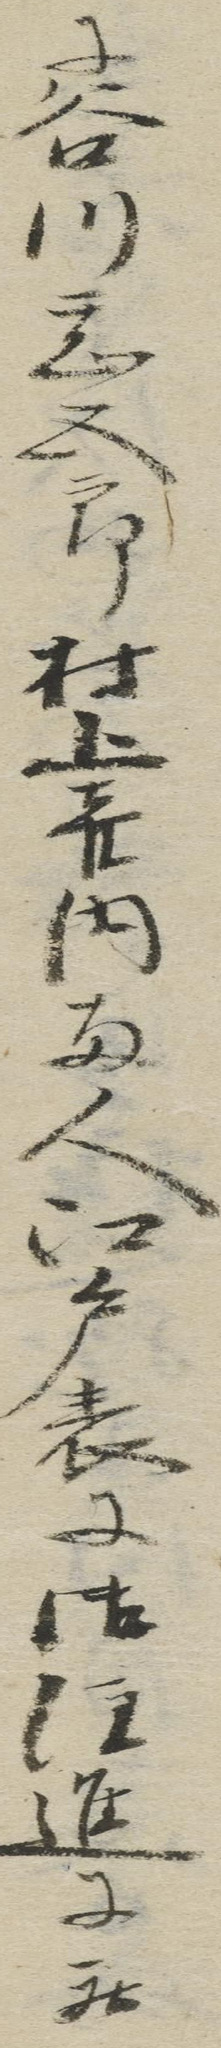に谷川甚五郎村上喜内両人江戸表に御注進に被
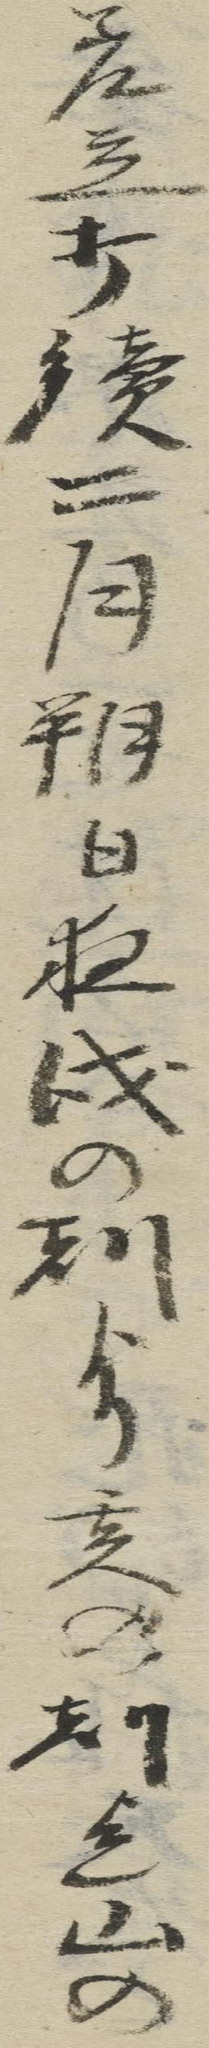差立打続二月朔日夜戌の刻より亥の刻迄山の
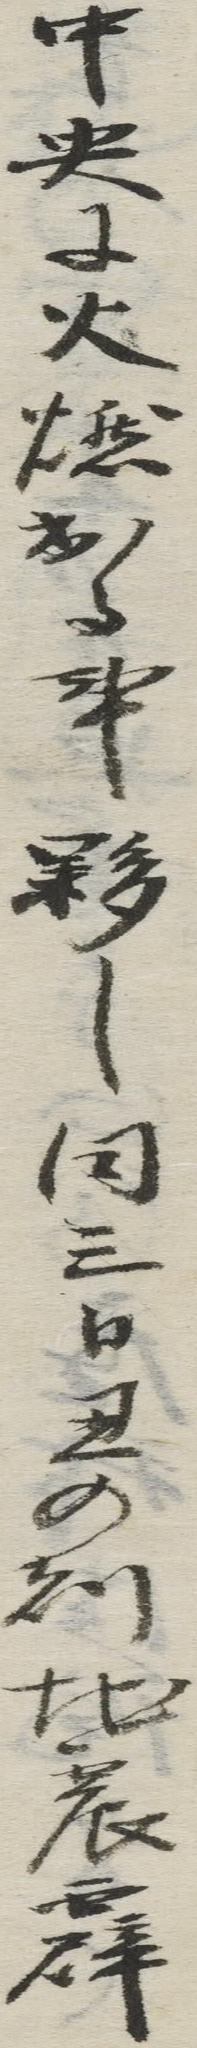中央に火燃出る事夥し同三日丑の刻地震霹
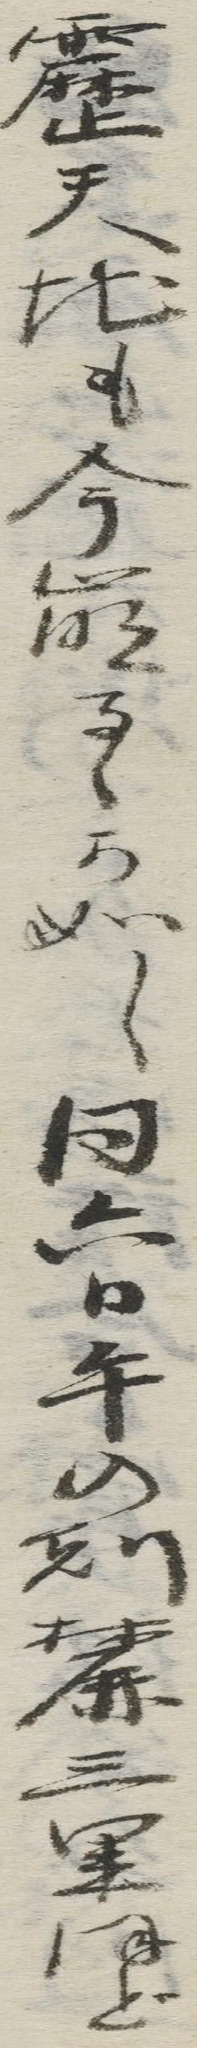靂天地も今崩るゝか如く同六日午の刻麓三里ほど
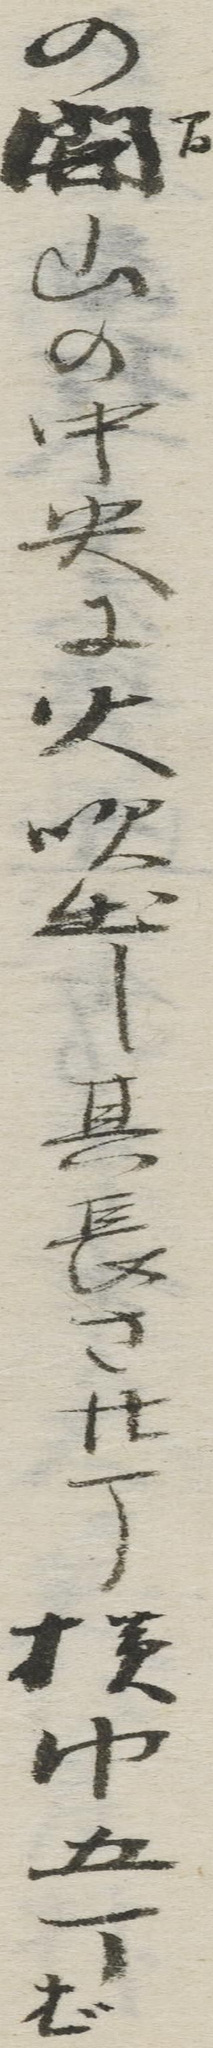の間山の中央に火吹出し其長さ廿丁横巾五丁ば
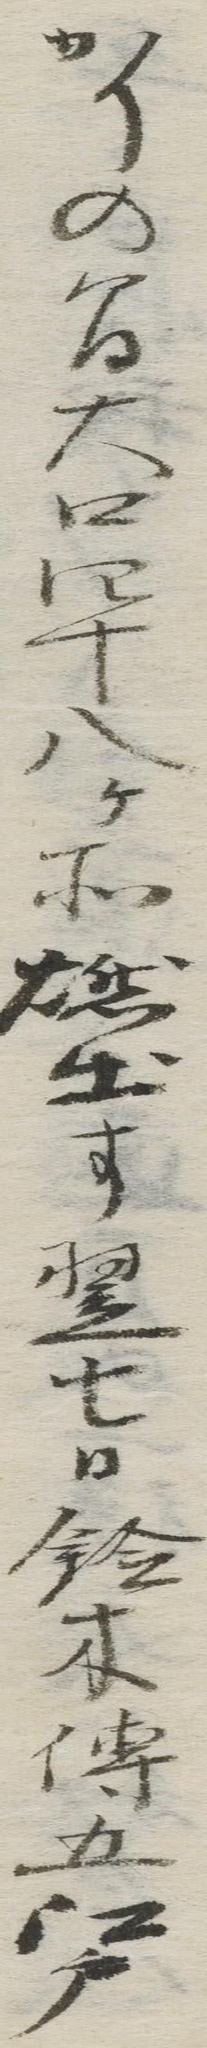かりの間大口四十八ケ所燃出す翌七日鈴木傳五江戸
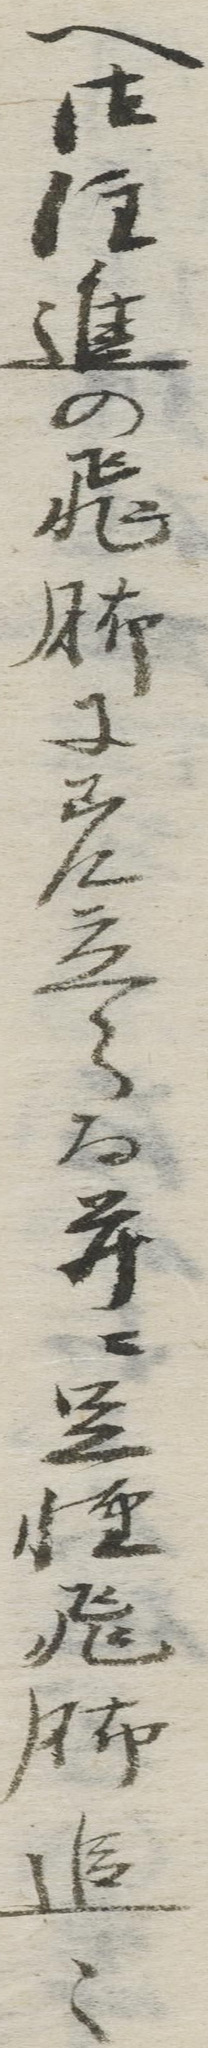へ御注進の飛脚に差立らる并ニ足軽飛脚追〻
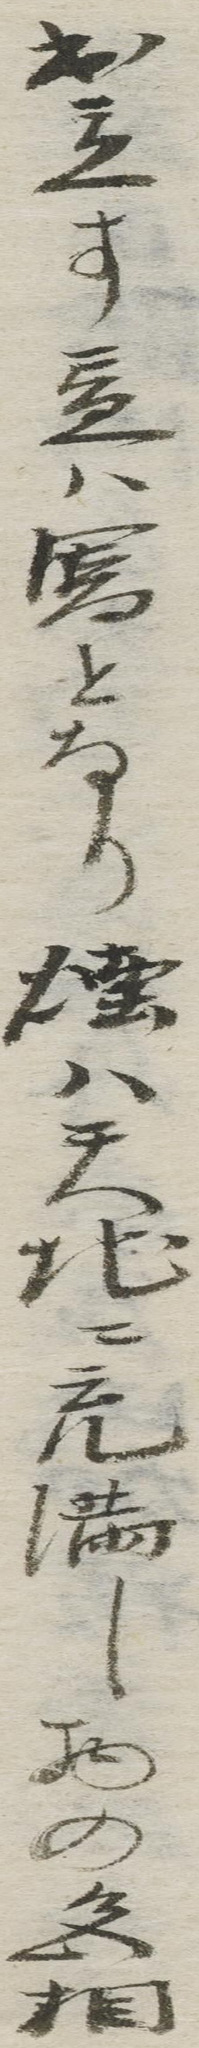出立す昼は闇となり煙ハ天地ニ充満し物の色相
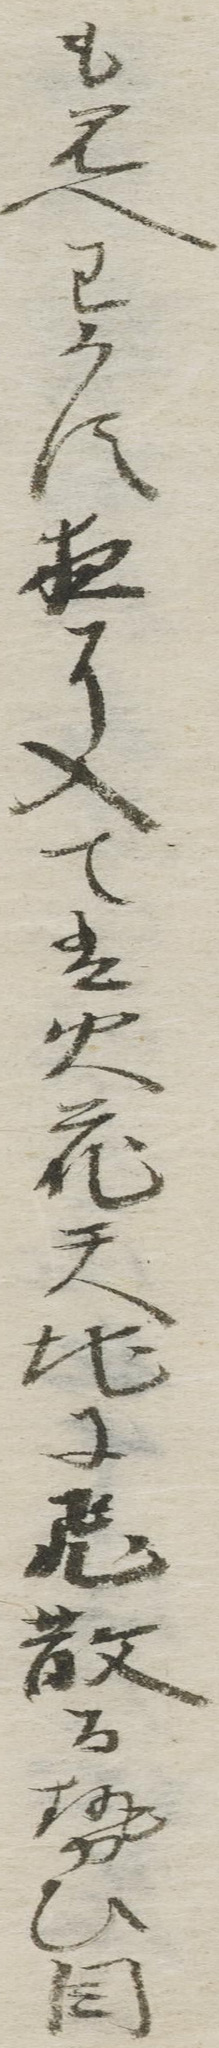も見へわかす夜に入ては火花天地に飛散る勢ひ目
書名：肥前國島原領普賢山大変記　完
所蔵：東京大学地震研究所図書室 Earthquake Research Institute Library, The University of Tokyo, JAPAN
